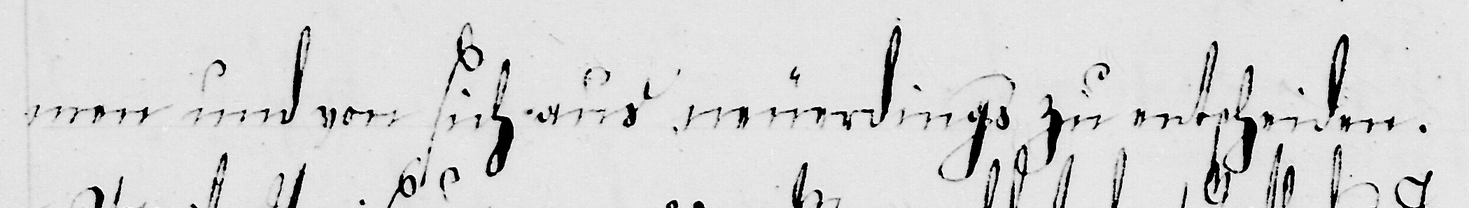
men und von sich aus neuerdings zu entscheiden.
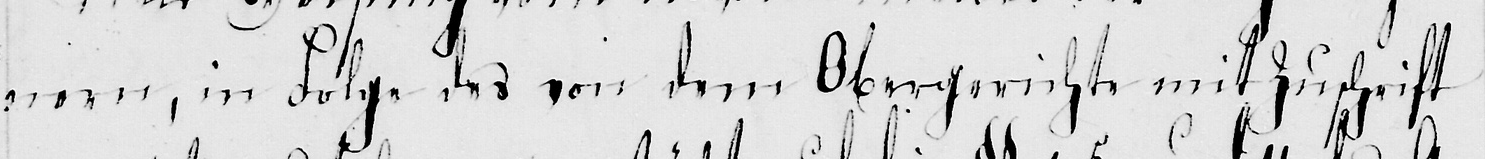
nern, in Folge des von dem Obergerichte mit Zuschrift
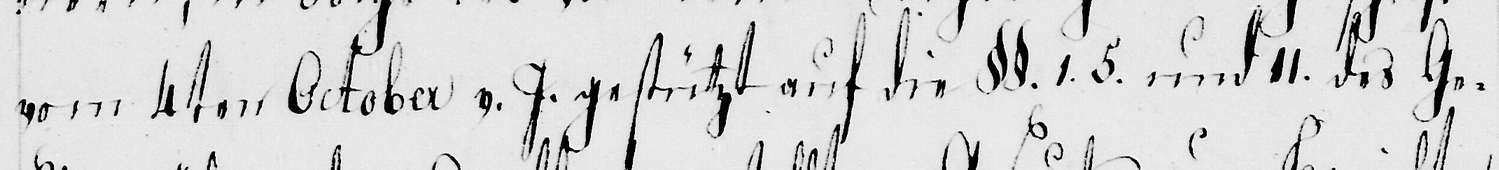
vom 4ten October v. J. gestützt auf die §§. 1. 5. und 11. des Ge¬
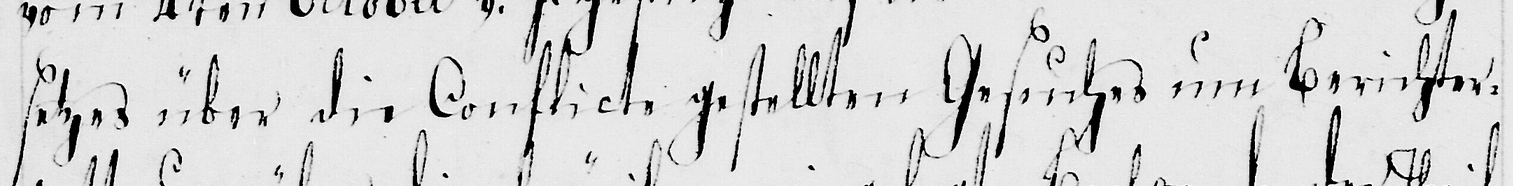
setzes über die Conflicte gestellten Gesuches um Berichter¬
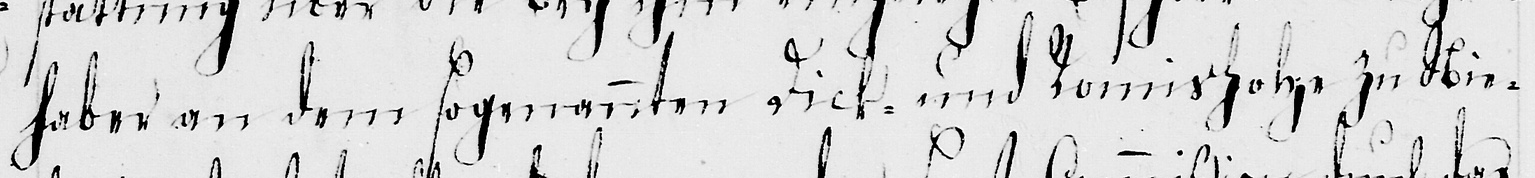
haber an dem sogenannten Dick- und Romisholze zu Nie¬
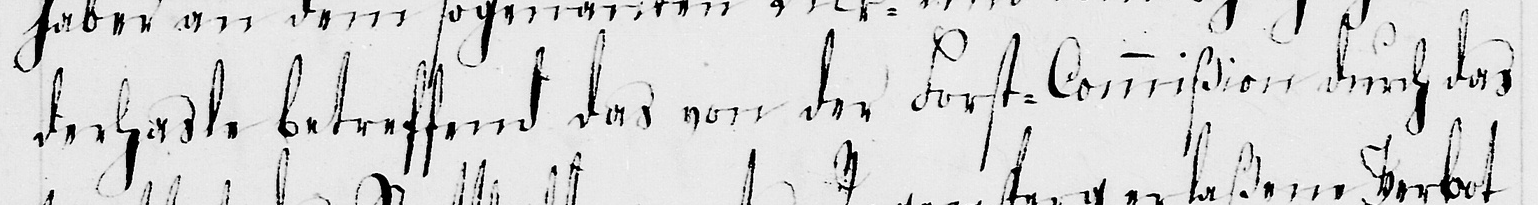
derhasle betreffend das von der Forst-Commißion durch das
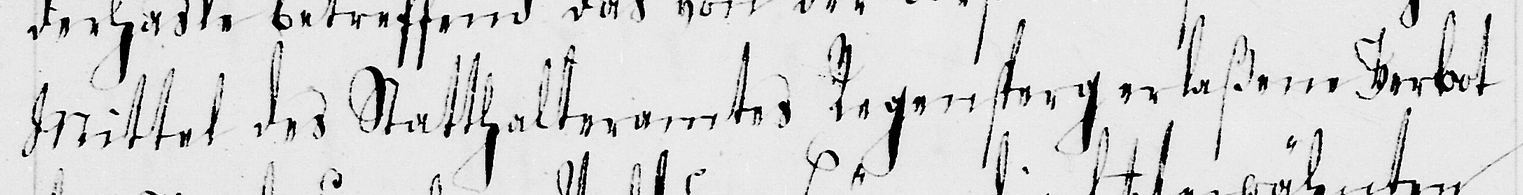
Mittel des Statthalteramtes Regensperg erlaßene Verbot
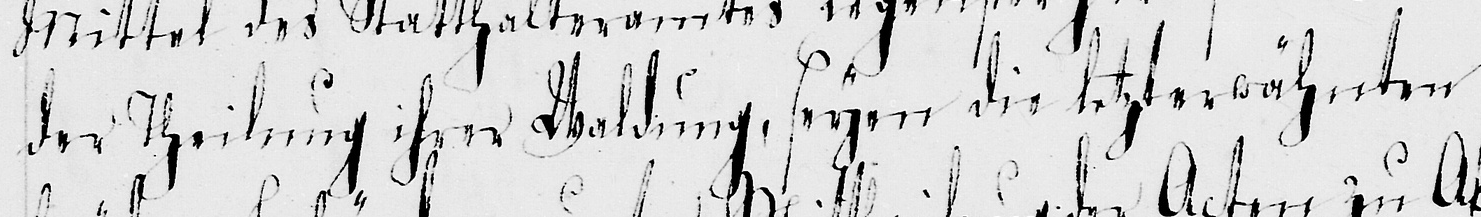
der Theilung ihrer Waldung, seyen die letzterwähnten
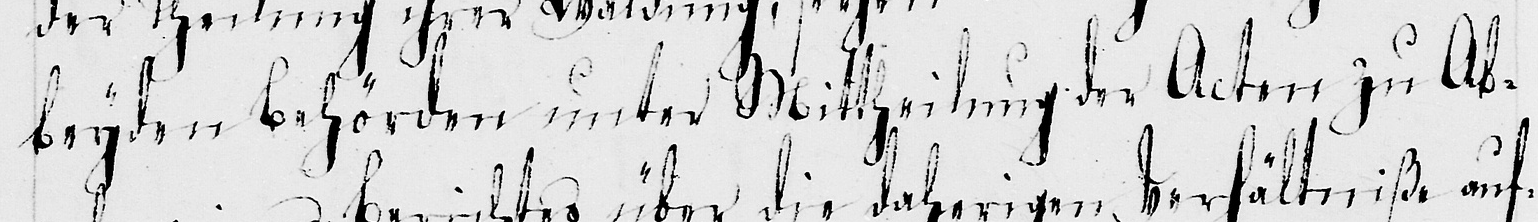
beyden Behörden unter Mittheilung der Acten zu Ab¬
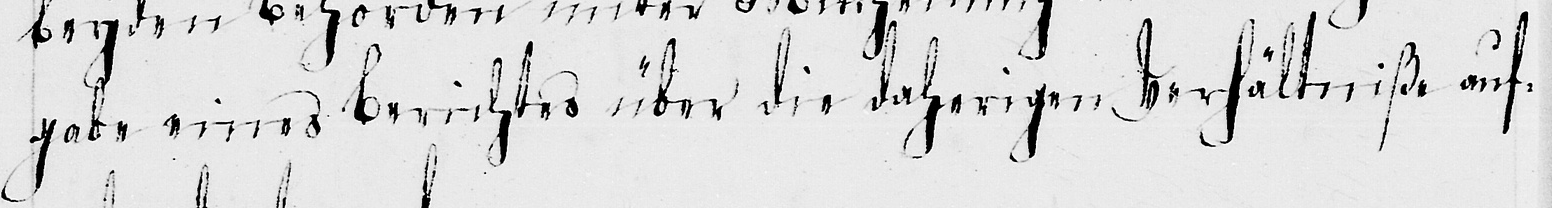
gabe eines Berichtes über die daherigen Verhältniße auf¬
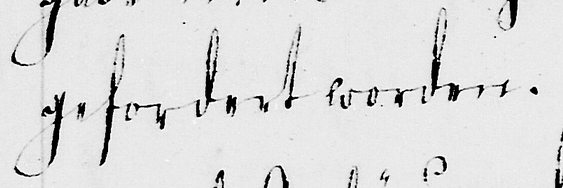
gefordert worden.
